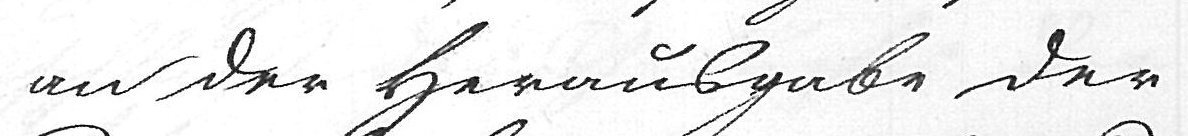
an der Herausgabe der
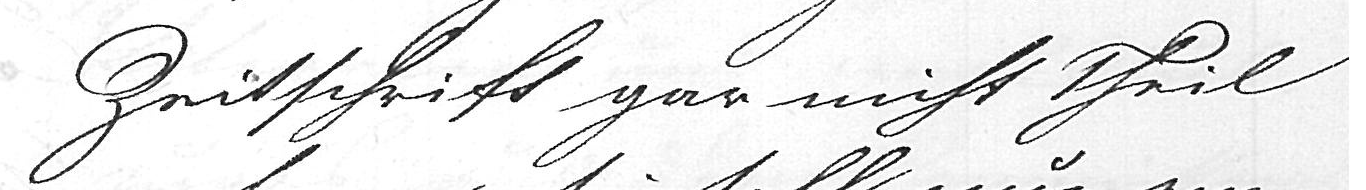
Zeitschrift gar nicht Theil
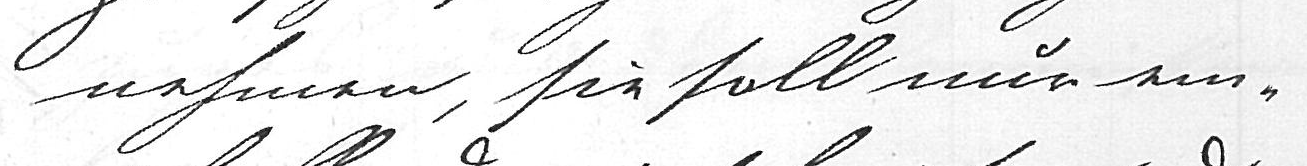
nehmen, sie soll nur em-
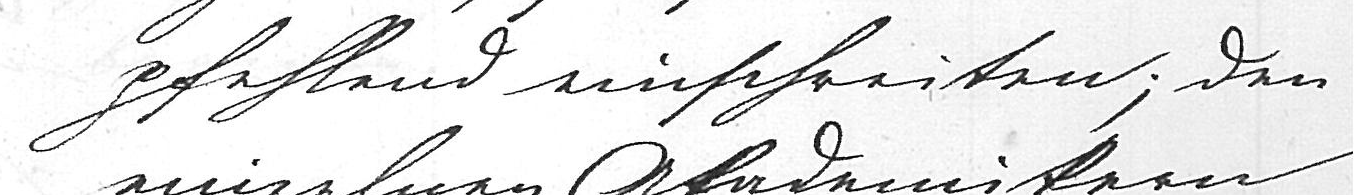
phehlend einschreiten; den
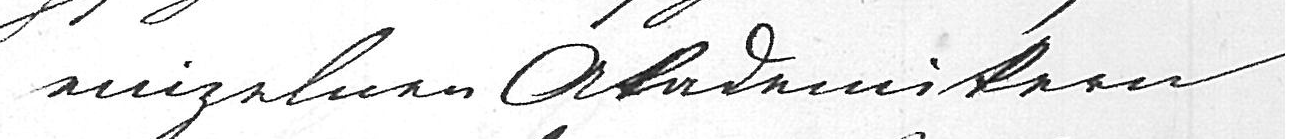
einzelnen Akademikern
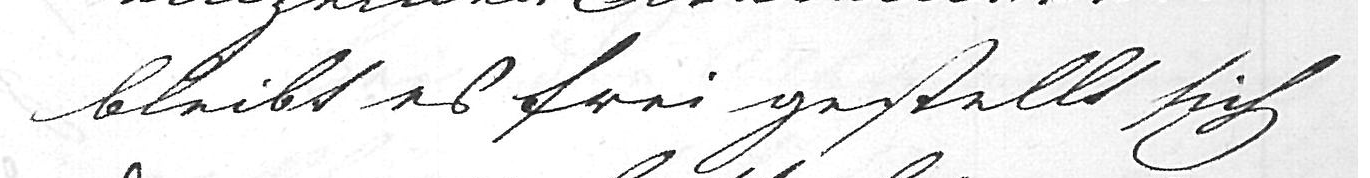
bleibt es frei gestellt sich
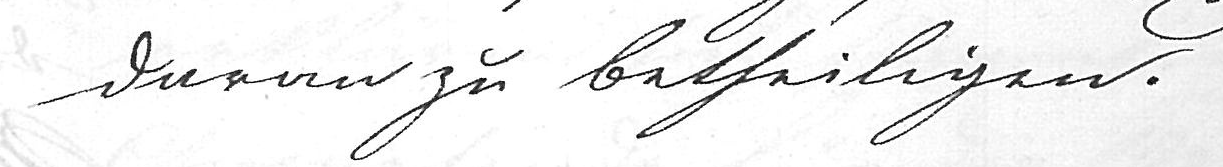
daran zu betheiligen.
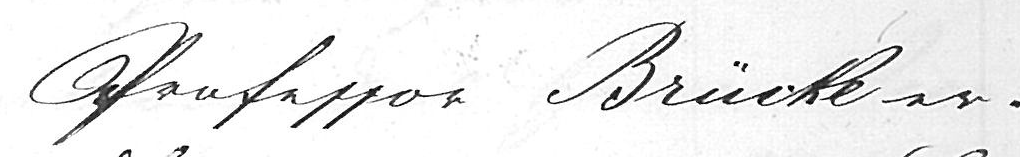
Professor Brücke er-
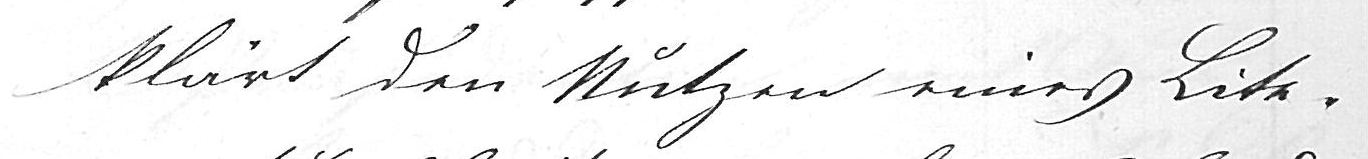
klärt den Nutzen eines Lite-
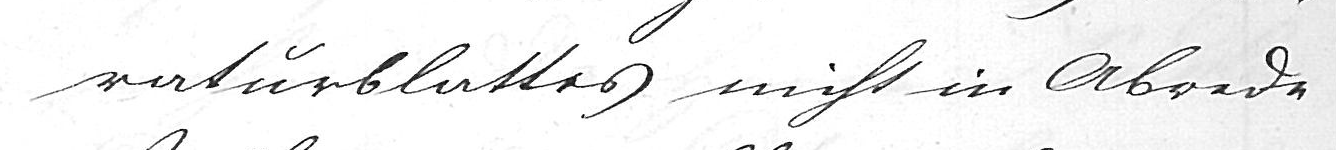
raturblattes nicht in Abrede
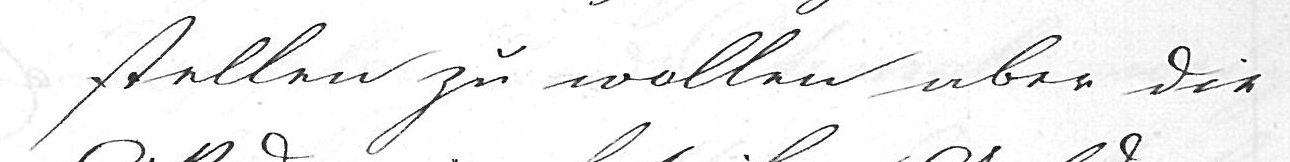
stellen zu wollen aber die
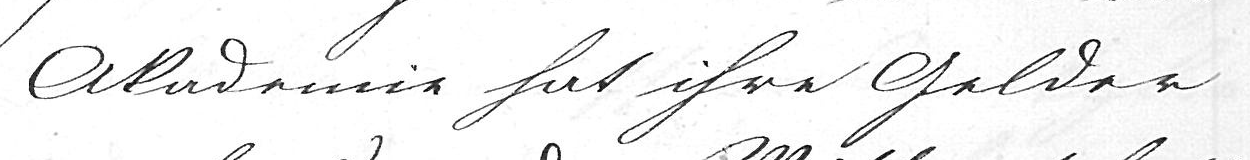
Akademie hat ihre Gelder
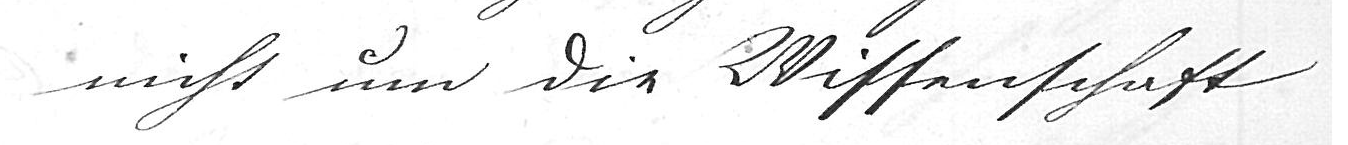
nicht um die Wissenschaft
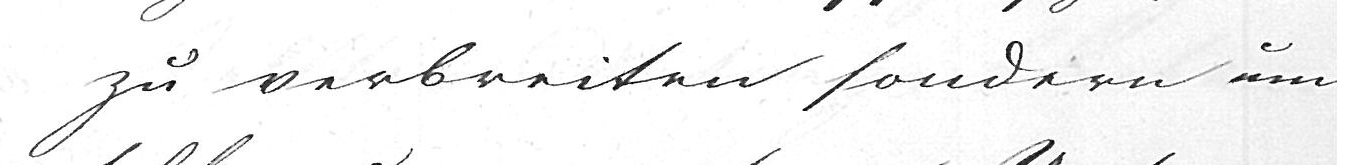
in verbreiten sondern um
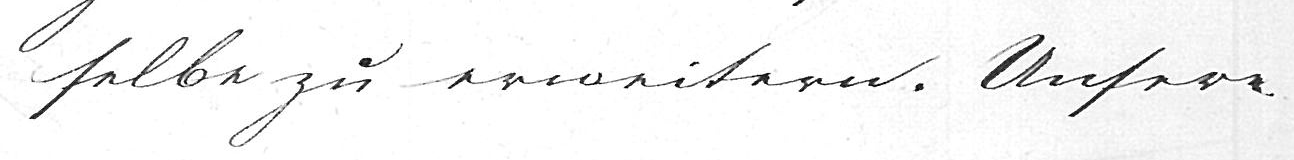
selbe zu erweitern. Unsere
